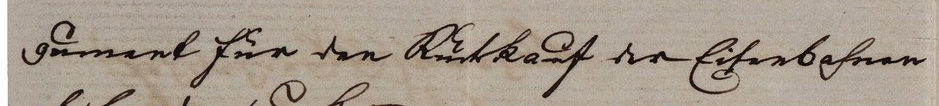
gument für den Rückkauf der Eisenbahnen
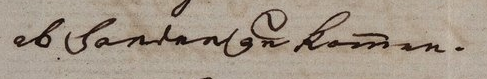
abhanden zu kommen.
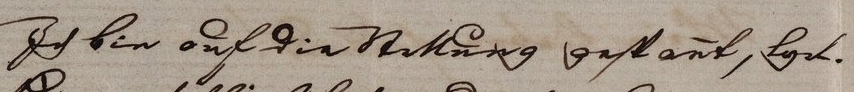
Ich bin auf die Stellung gespannt, wel-
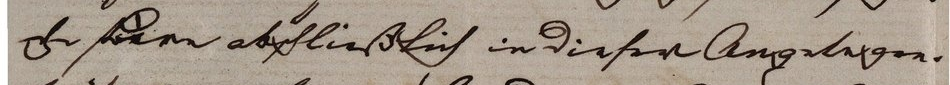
che Bern abschließlich in dieser Angelegen-
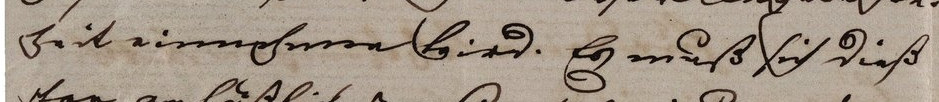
heit einnehmen wird. Es muß sich dieß
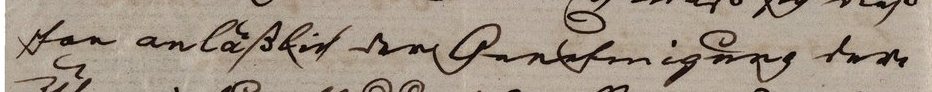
schon anläßlich der Genehmigung der
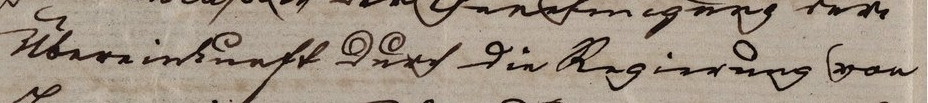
Übereinkunft durch die Regierung von
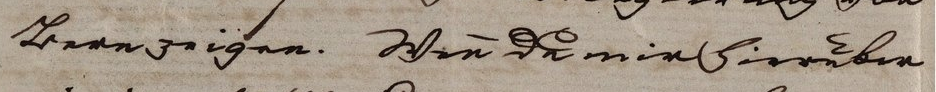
Bern zeigen. Wenn Du mir hierüber
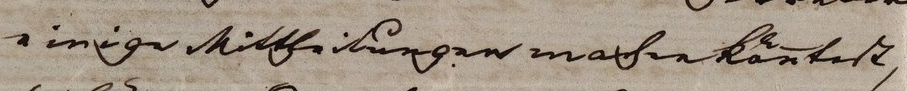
einige Mittheilungen machen könntest,
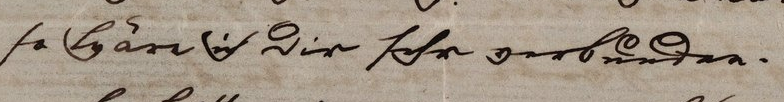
so wäre ich Dir sehr verbunden.
